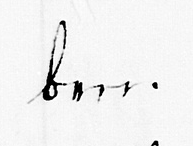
ben.
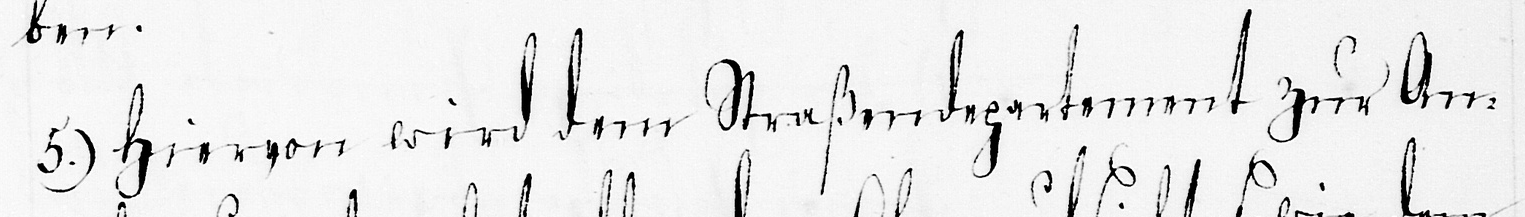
5.) Hiervon wird dem Straßendepartement zur An¬
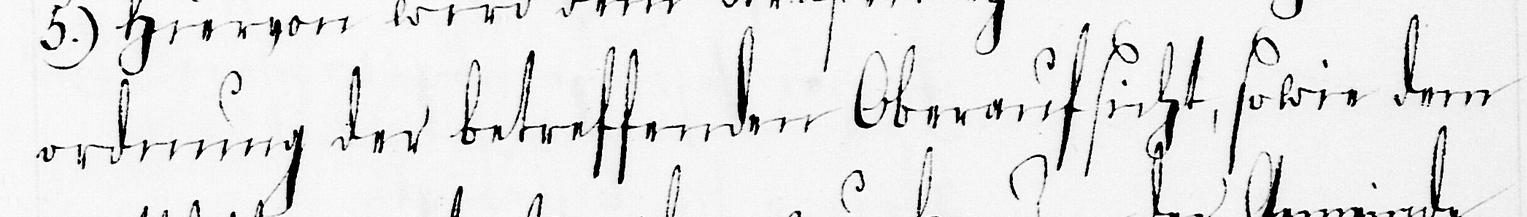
ordnung der betreffenden Oberaufsicht, sowie dem
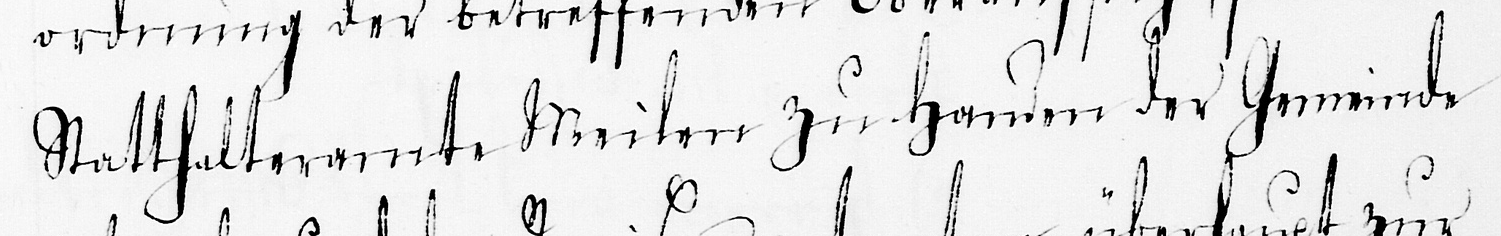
Statthalteramte Meilen zu Handen der Gemeinde
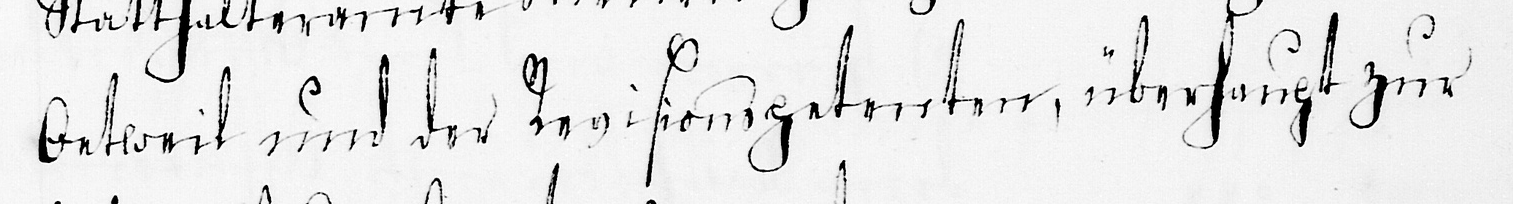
Oetweil und der Revisionspetenten, überhaupt zur
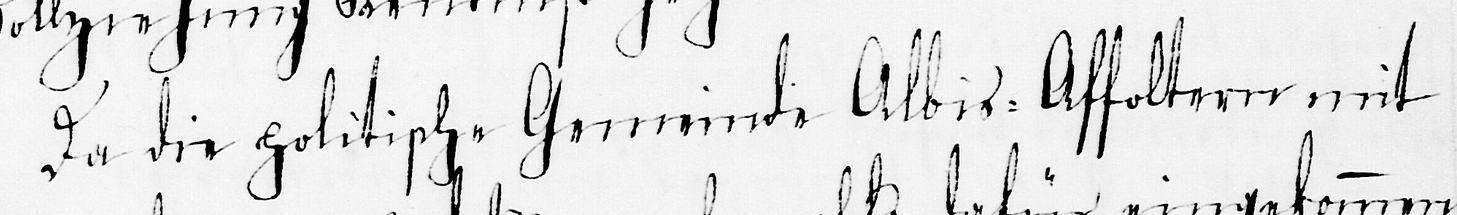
Da die politische Gemeinde Albis-Affoltern mit
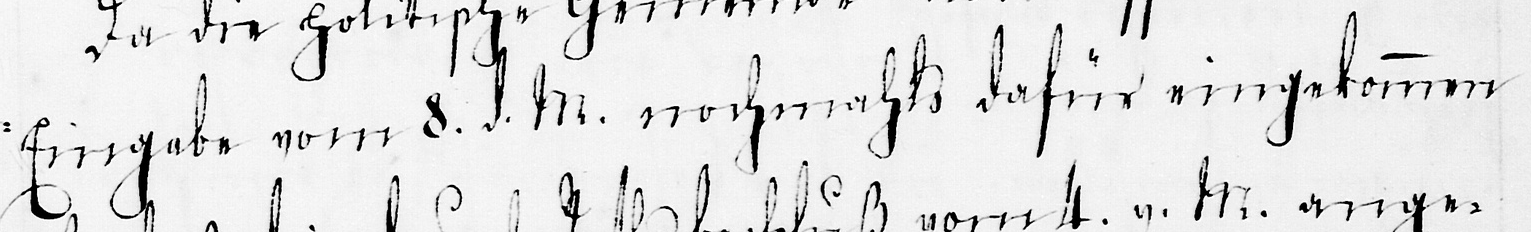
Eingabe vom 8. d. M. nochmahls dafür eingekommen
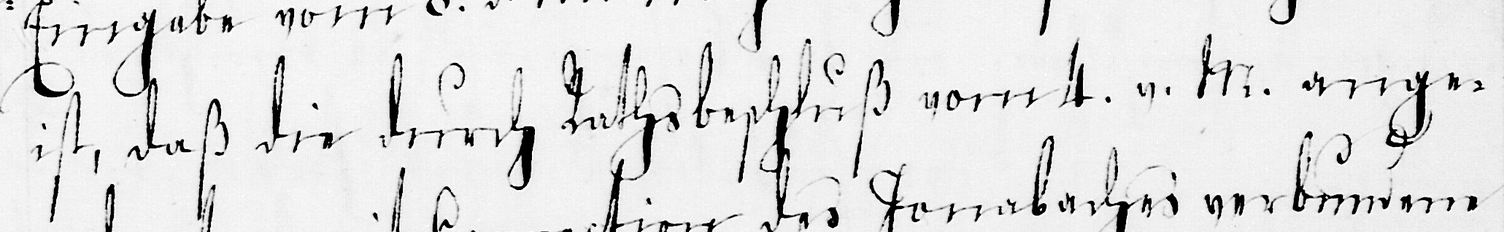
ist, daß die durch Rathsbeschluß vom 4. v. M. ange¬
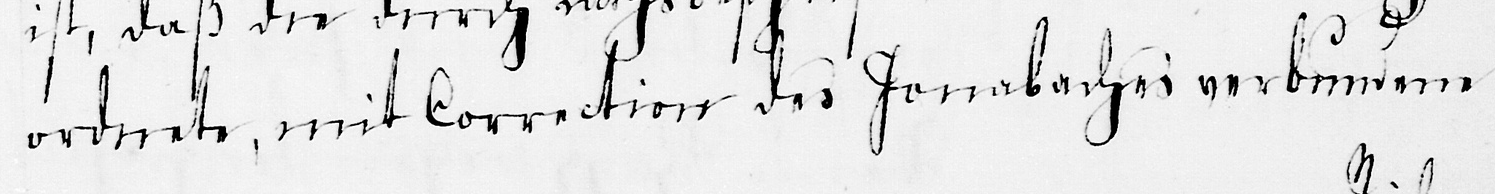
ordnete, mit Correction des Jonabaches verbundene
